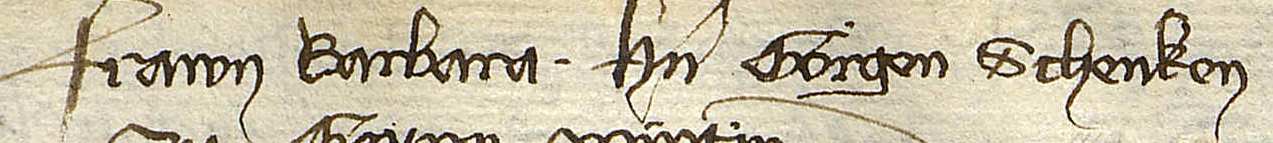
Frawn Barbara . H*n Görgen Schenken
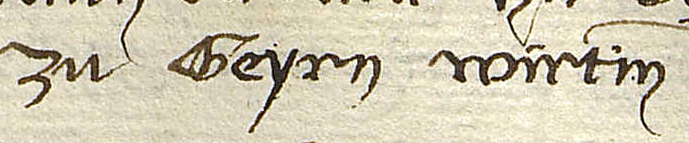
ʒu Geyrn wirtin*
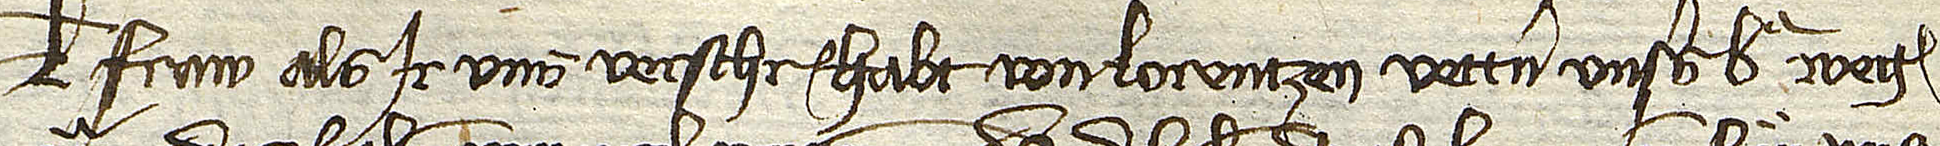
L* fraw als Ir vns verſchr* habt von Lorencʒen vettn* vnſ*s b* weg*
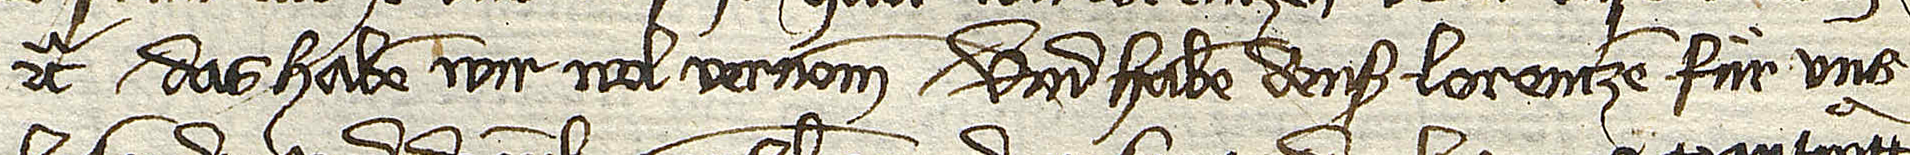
ec* / das habe* wir wol vernom* / Vnd habe* denſ* Lorencʒe* für vns
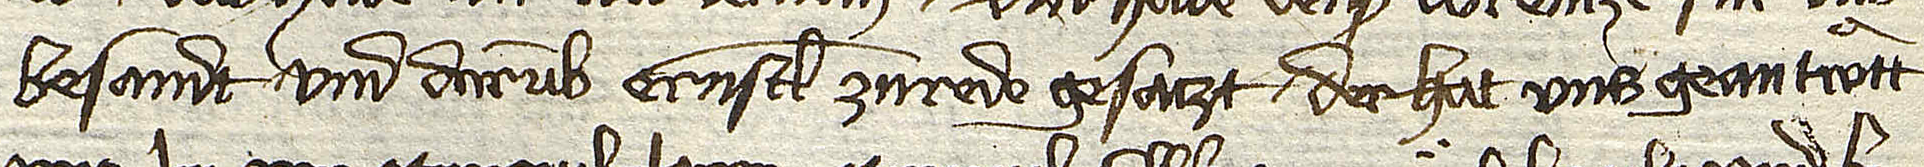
beſandt vnd daru*b ernſtl* ʒurede geſacʒt / der hat vns geantw*tt
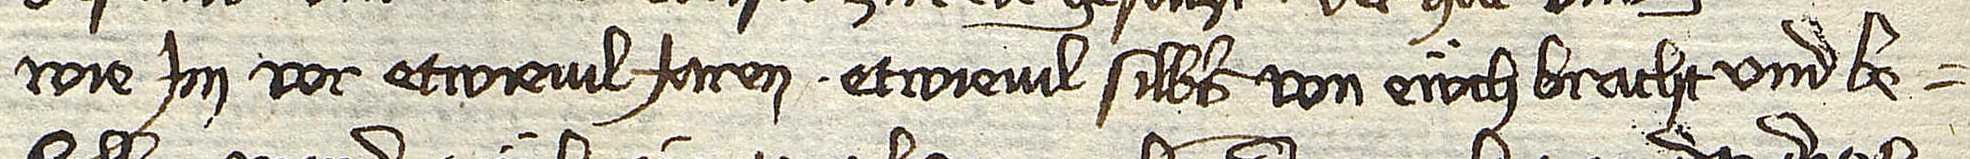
wie Im vor etwieuil Iaren . etwieuil ſilb*s von ewch bracht vnd be =
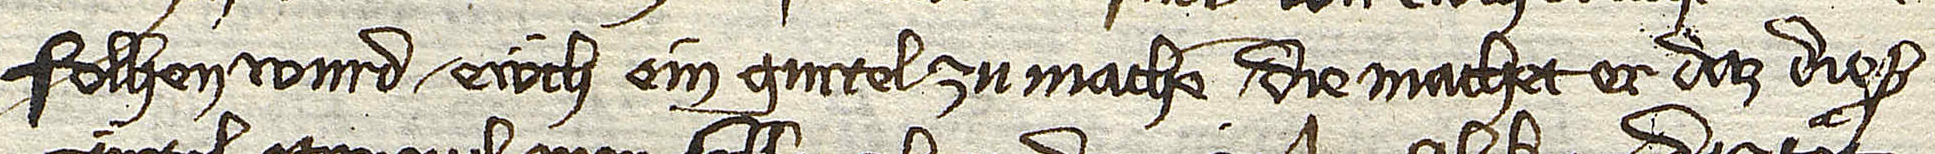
folhen wurd / ewch ein gurtel ʒu mache* / die machet er daʒ dieſ*
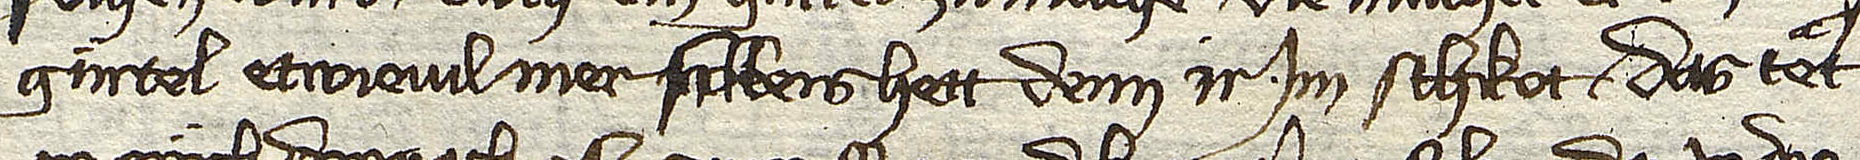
gürtel etwieuil mer ſilbers hett denn ir . Im ſchiket / Das tët
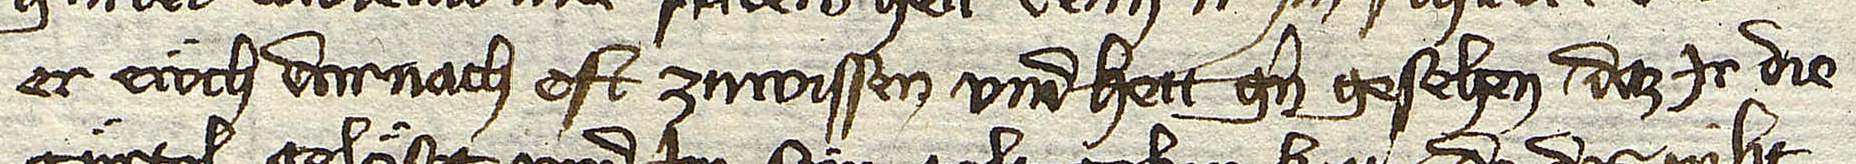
er ewch darnach oft ʒuwiſſen vnd hett g*n geſehen / daʒ Ir die
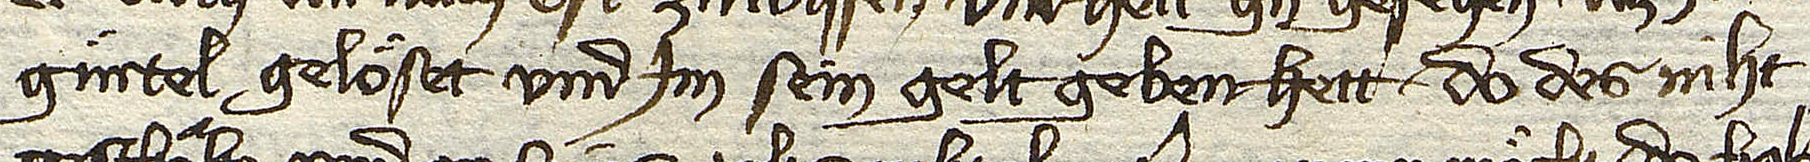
gürtel gelöſet vnd Im ſein gelt geben hett / do des niht
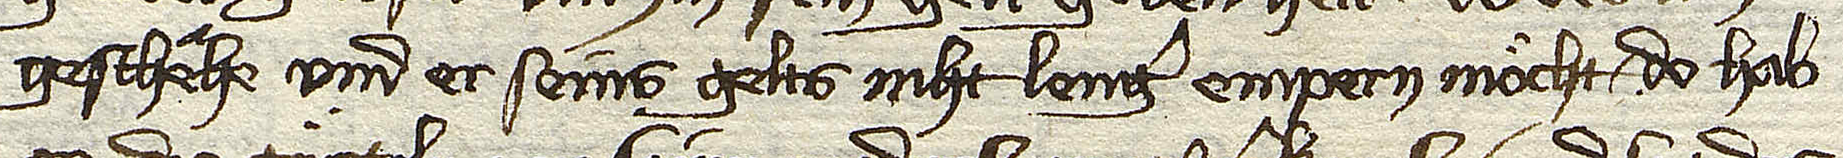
geſchëhe vnd er ſeins gelts niht leng* empern möcht / . do hab
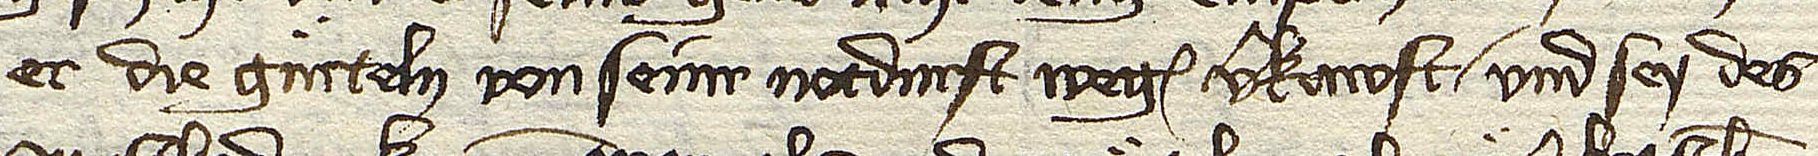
er die gürteln von ſeinr notdurft weg* v*kawft / vnd ſey des
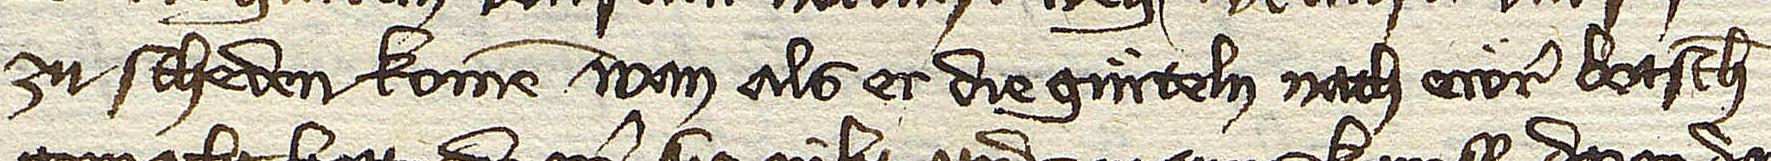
ʒu ſcheden kome* wan als er die gürteln nach ew*r botſch*
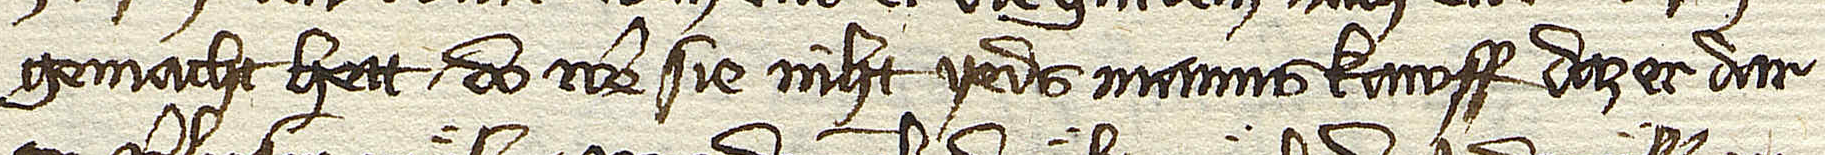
gemacht hett / do w*e ſie niht yeds manns kawff daʒ er dar
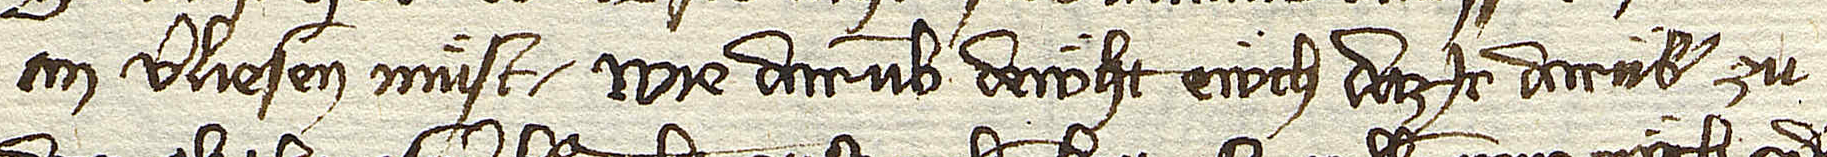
in v*lieſen müſt / wie daru*b dewht ewch daʒ Ir darüb* ʒu
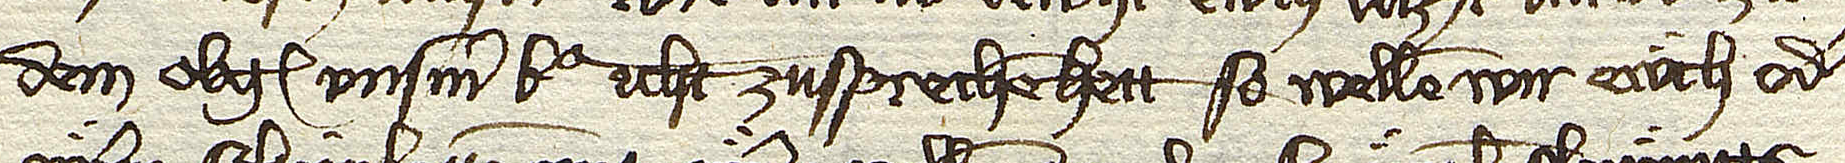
dem obg* vnſ*m b* icht ʒuſpreche* hett ſo welle* wir ewch od*
